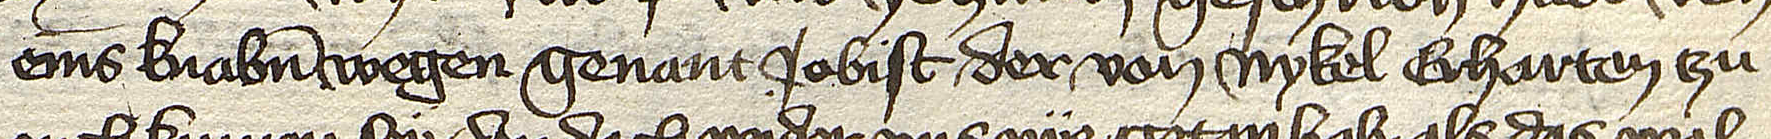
eins* knabn* wegen genant Iobiſt / der von Nykel Erharten cʒu
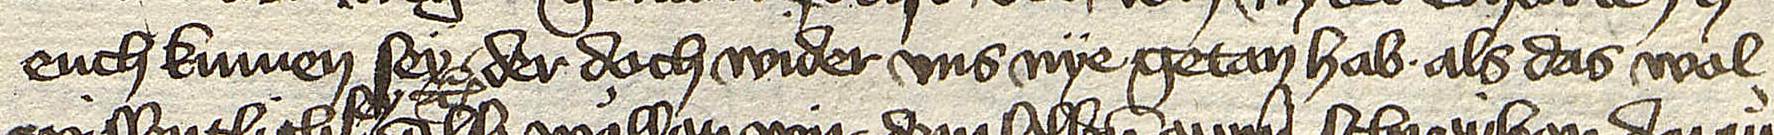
euch kumen ſey / der doch wider vns nye getan hab . als das wol
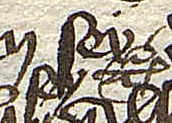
ſey ec*
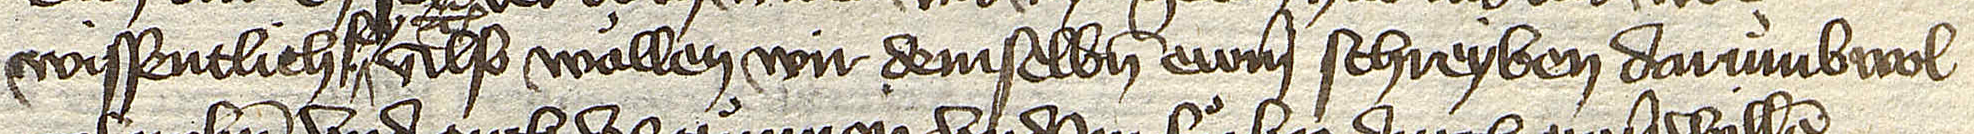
wiſſentlich . Alſo wöllen wir demſelbn* ewm* ſchreyben darümb wol
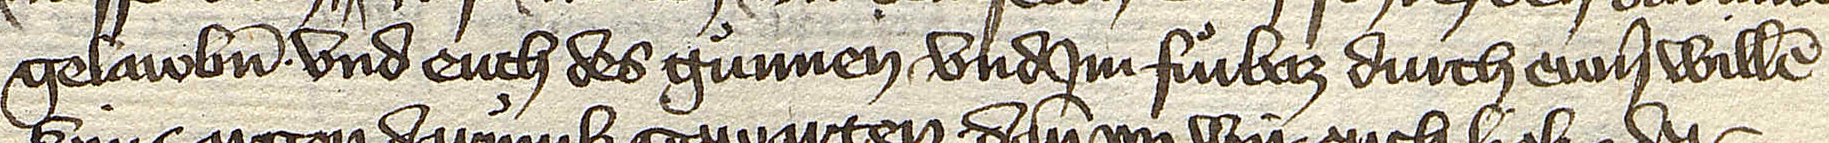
gelawbn* . vnd euch des günnen / vnd Im fürbaʒ durch ew*n wille*
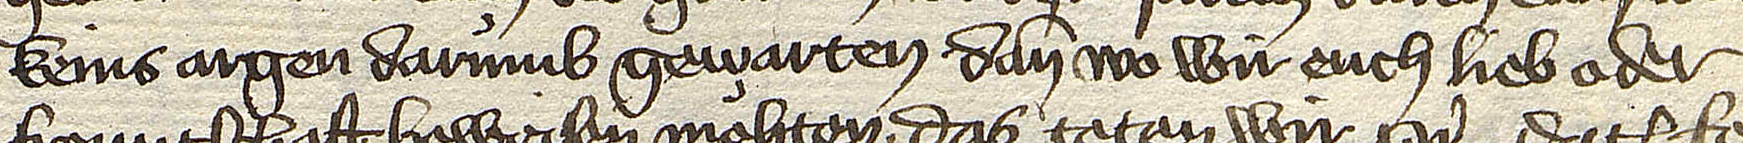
keins argen darümb gewarten / dan* wo wir euch lieb oder
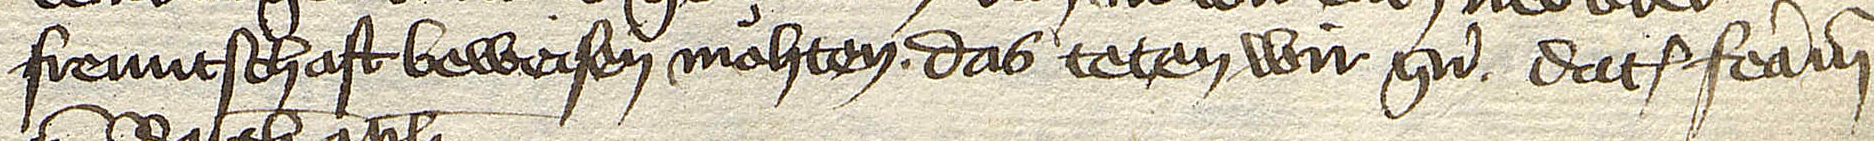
freuntſchaft beweiſen möhten . das teten wir gn* . dat* fea* iii*
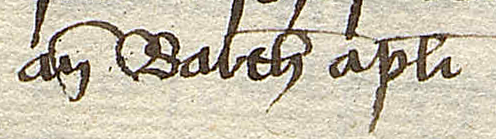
an* Barth* apli*
